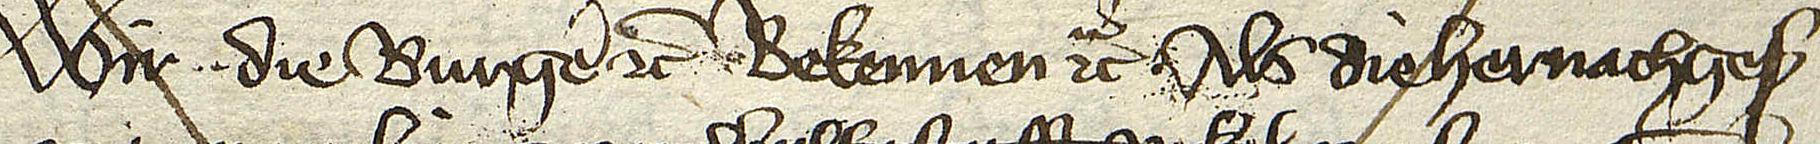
Wir ~ die Burge* ec* Bekennen ec* . Als die hernachgeſ*
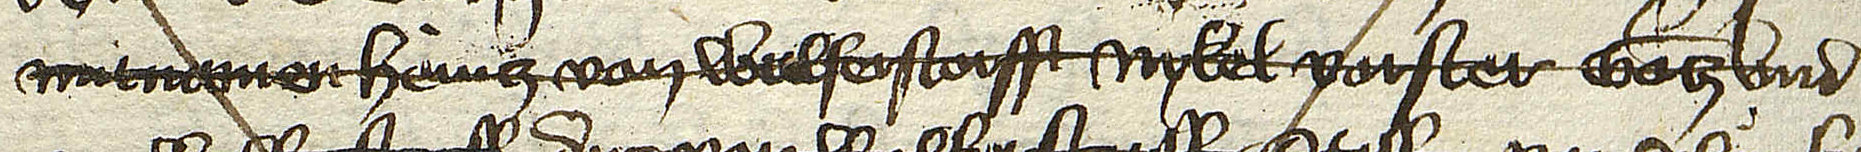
mitnamen heincʒ von Wolferſtorff Nykel vorſter Gocʒ vnd
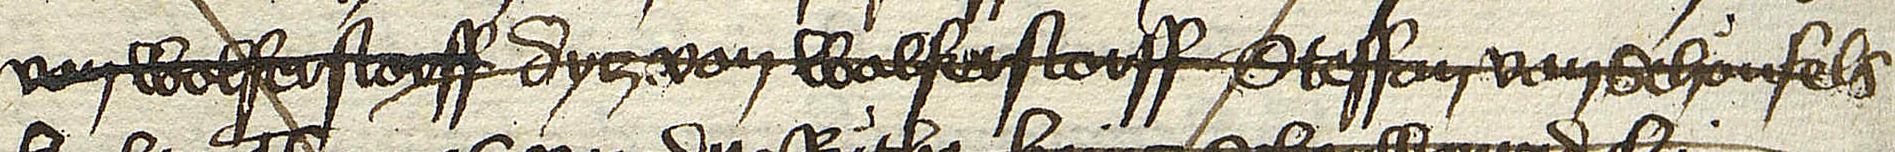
von Wolferſtorff dycʒ von Wolferſtorff / Steffan von Schönfels
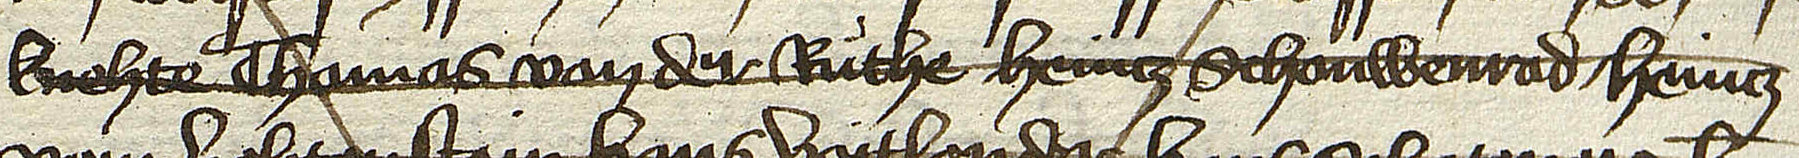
knehte Thomas von der Rüthe heincʒ Schonwenrad / Heincʒ
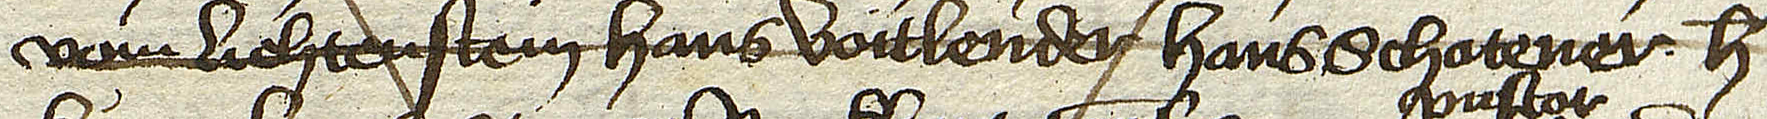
von liehtenſtein hans Voitlender hans Schotener . h*
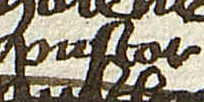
puſtor
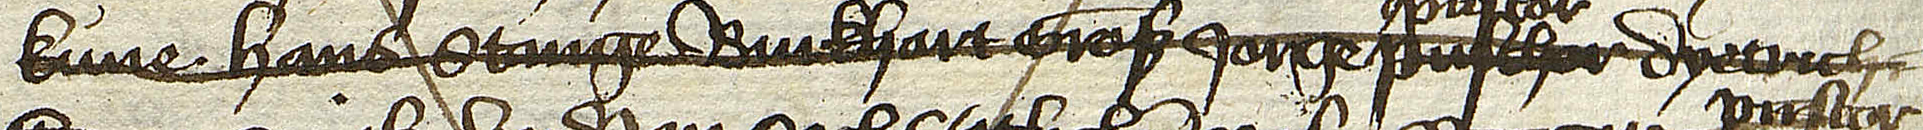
küne . hans Stange Burkhart Groſʒ Iorge puſcher dyetrich
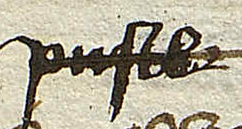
puſtl
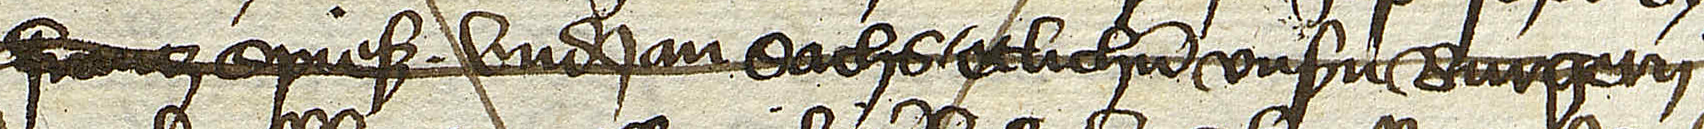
Francʒ Spieſʒ . vnd Ian Sachs / etlich*n vnſ*n Burgern
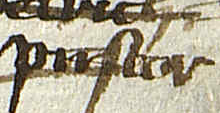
puſtor
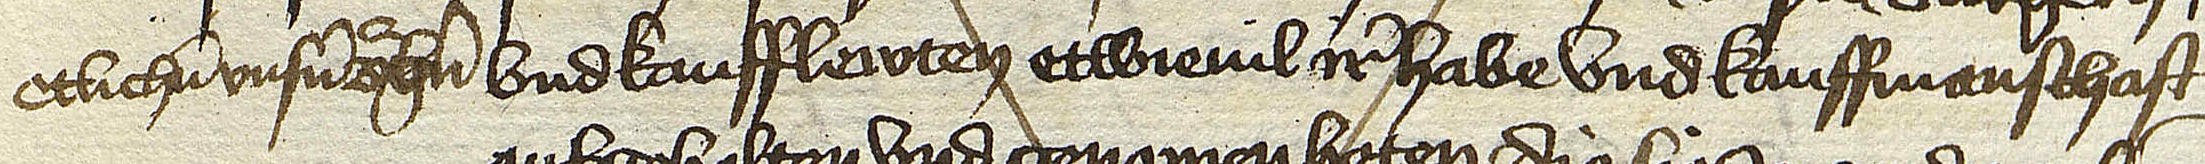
etlich*n vnſ*n B* g*n vnd kaufflewten ettwieuil ir* habe vnd kauffmanſchaft
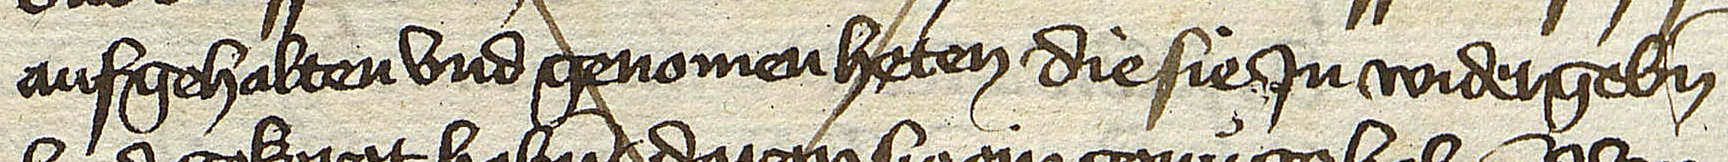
aufgehalten vnd genomen heten / die ſie In widergeb*n
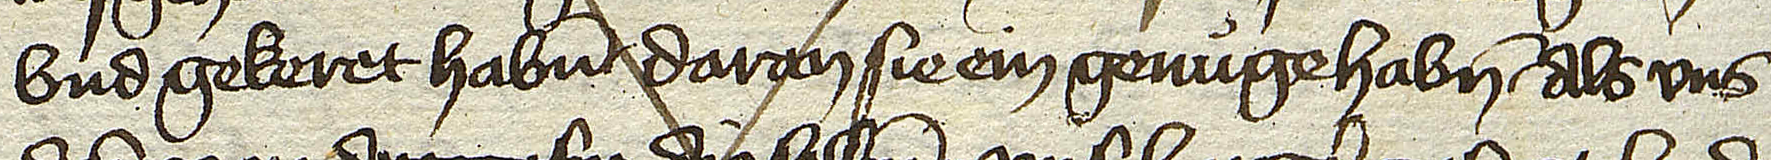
vnd gekeret hab*n / daran ſie ein genüge hab*n / Als vns
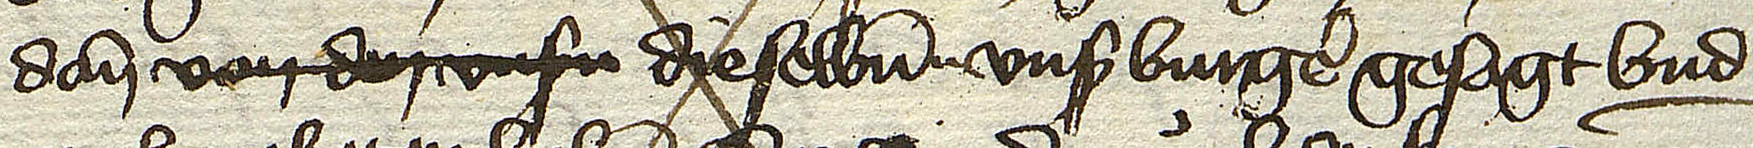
dan* von den vnſ*n dieſelb*n ~ vnſ* burge* geſagt vnd
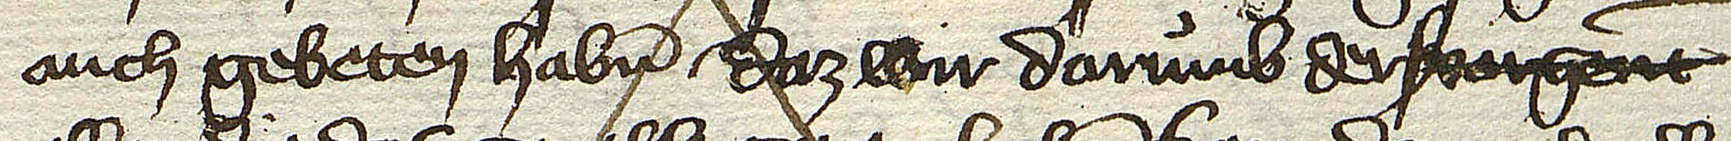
auch gebeten hab*n / daʒ wir darümb derſ* vorgen*t*
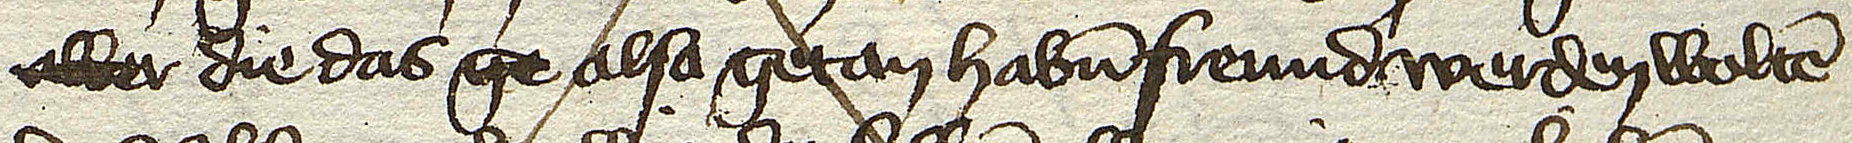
aller die das ge alſo getan hab*n freund werden wolte*
